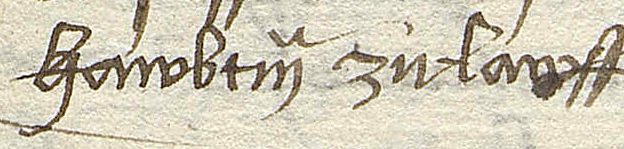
Hawbtm* ʒu lawff
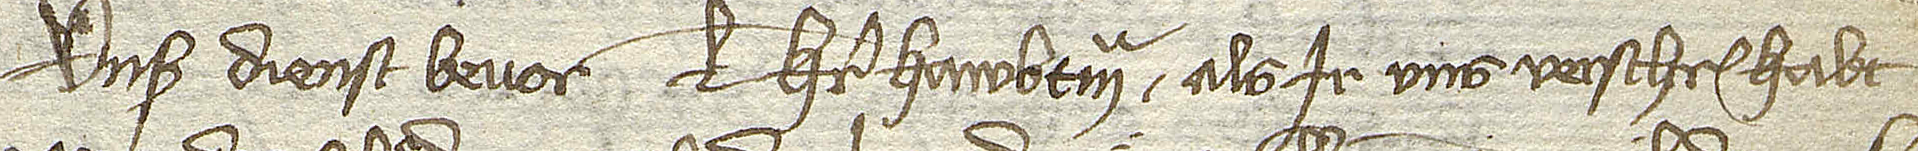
Vnſ* dienſt beuor L* hr* hawbtm* / als Ir vns verſchr* habt
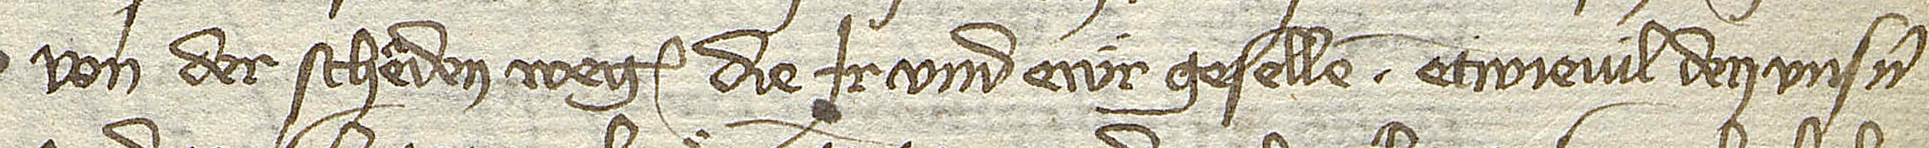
von der ſchëden weg* die Ir vnd ewr geſelle* . etwieuil den vnſ*n
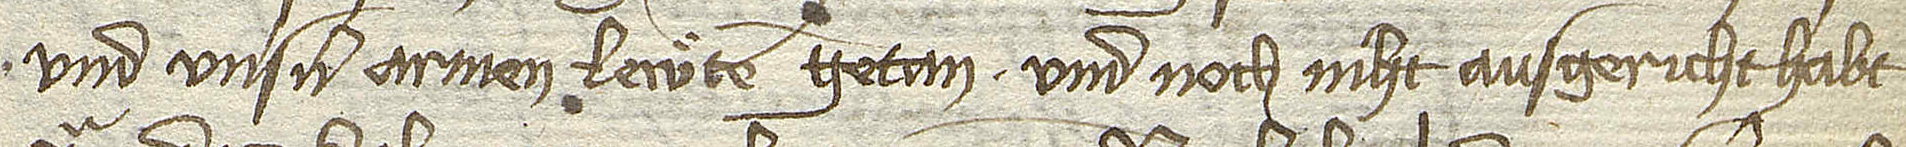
vnd vnſ*n armen lewte* getan . vnd noch niht auſgericht habt
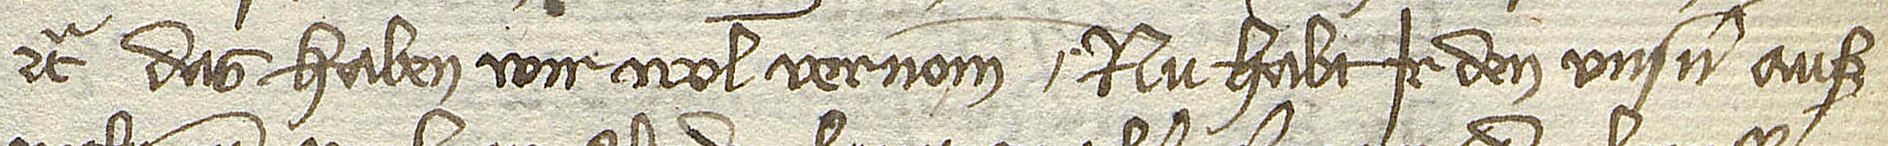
ec* das haben wir wol vernom* / Nu habt Ir den vnſ*n auſʒ
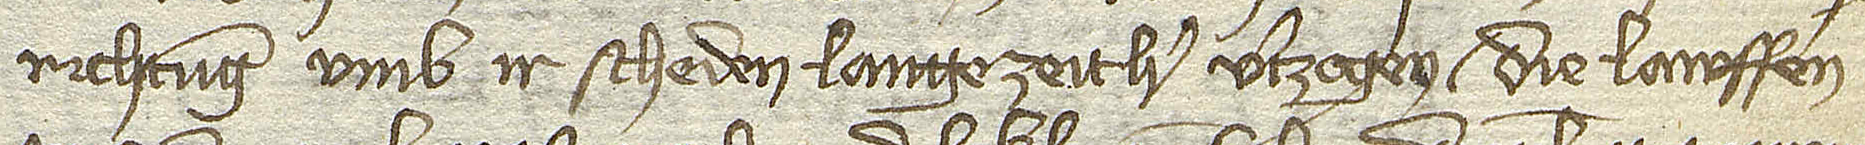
richtug* vmb ir ſcheden lange ʒeit h* v*cʒogen / die lawffen
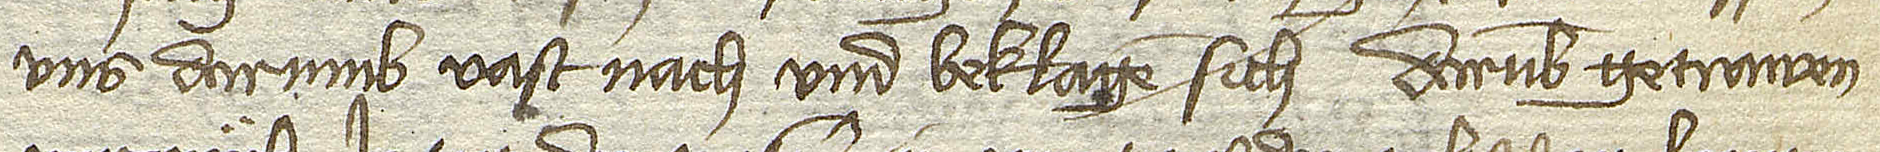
vns darumb vaſt nach vnd beklage* ſich darub* getrawen
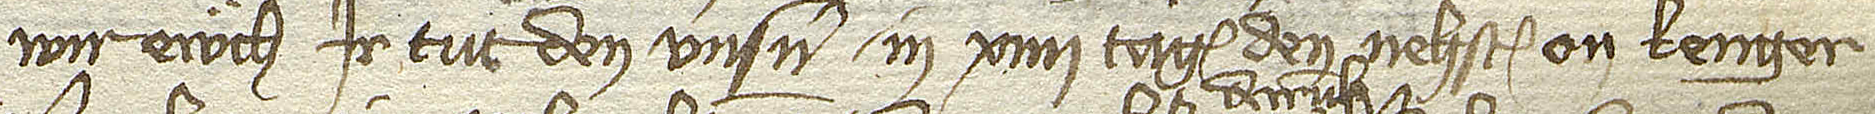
wir ewch Ir tut den vnſ*n / in xiiii tag* den nehſt* on lenger
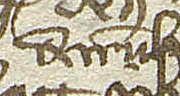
darub*
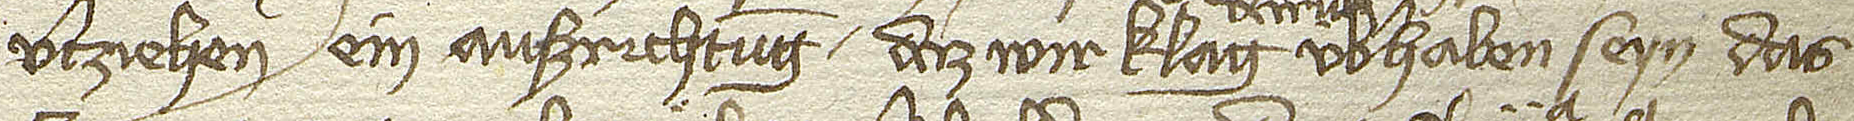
v*cʒiehen ein auſʒrichtug* / daʒ wir klag vb* haben ſeyn das
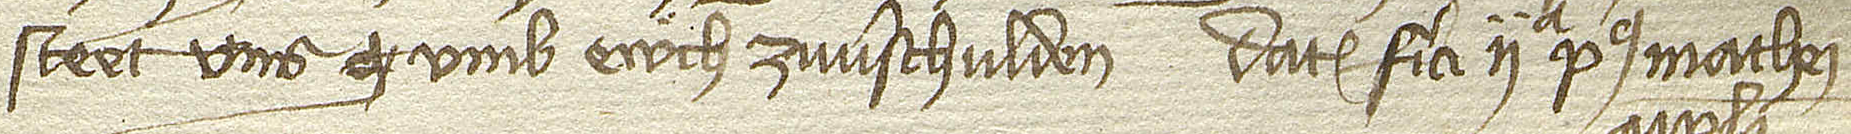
ſteet vns g vmb ewch ʒuu*ſchulden Dat* fia* ii* p* mathei
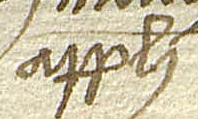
appli*
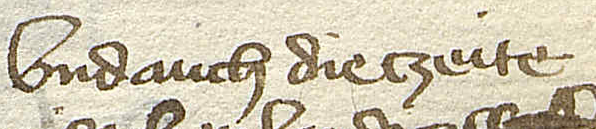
vnd auch die cʒeite
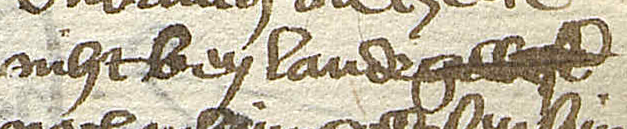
niht bey lande geweſe*
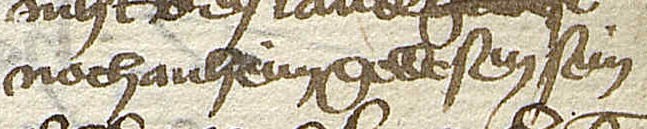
noch anheim geweſen ſein
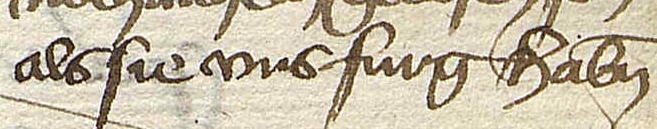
als ſie vns furg* habn*
